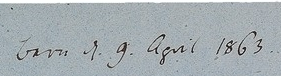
Bern d. 9. April
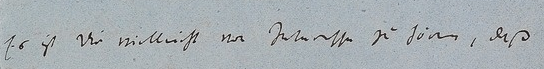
Es ist Dir vielleicht von Interesse zu hören, daß
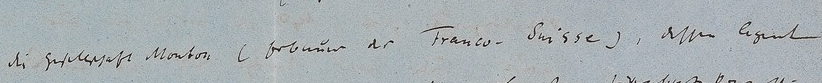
die Gesellschaft Monton (Erbauer der Franco-Suisse), dessen Agent
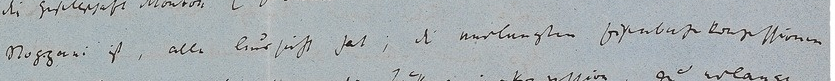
Stoppani ist, alle Aussicht hat, die verlangten Eisenbahnkonzessionen
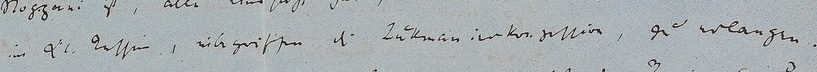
im KtTessin, inbegriffen die Lukmanierkonzession, zu erlangen.
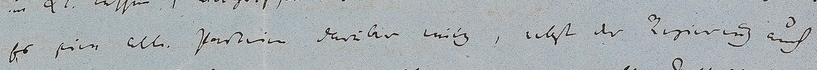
Es seien alle Parteien darüber einig, nebst der Regierung auch
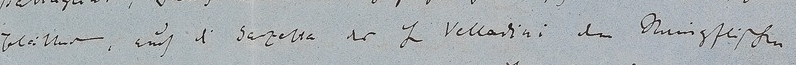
Blätter, auch die Gazetta des Herrn Velladini dem Stämpflischen
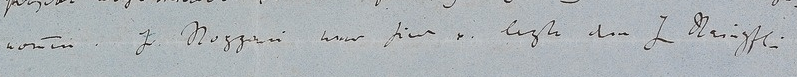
nommen. Hr. Stoppani war hier &. legte dem Herrn Stämpfli
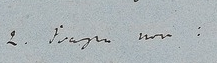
2. Fragen vor:
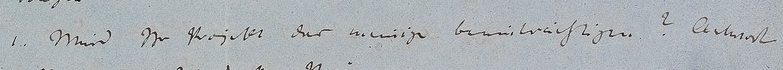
1. Wird Ihr Projekt das meinige beeinträchtigen? Antwort
